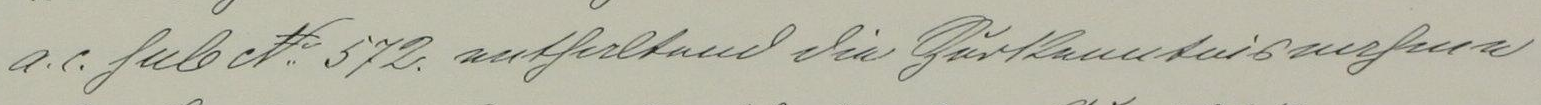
a.c. sub No. 572. enthaltend die Zurkenntnisnahme
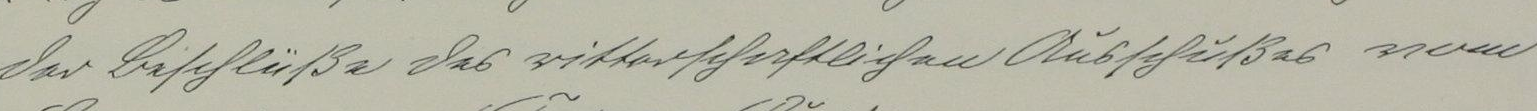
der Beschlüße des ritterschaftlichen Ausschußes vom
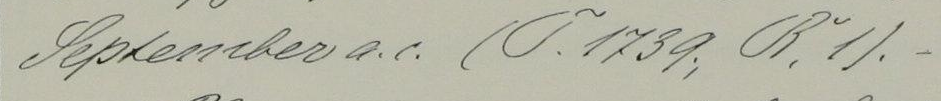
September a.c. (T.1739; R.1).
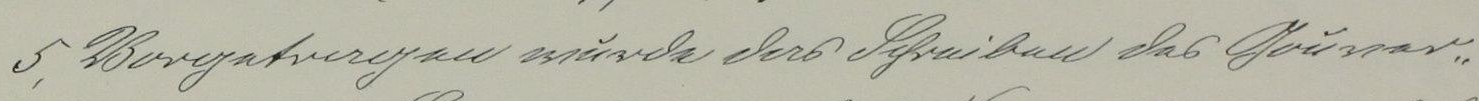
5. Vorgetragen wurde das Schreiben des Gouver-
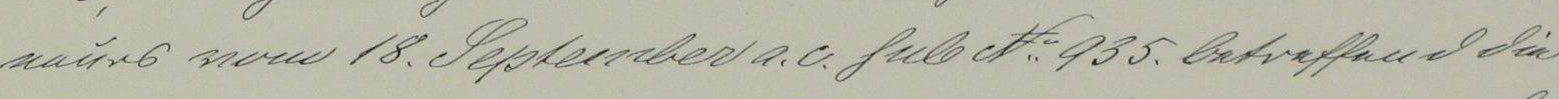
neurs vom 18. September a.c. sub No. 935. betreffend die
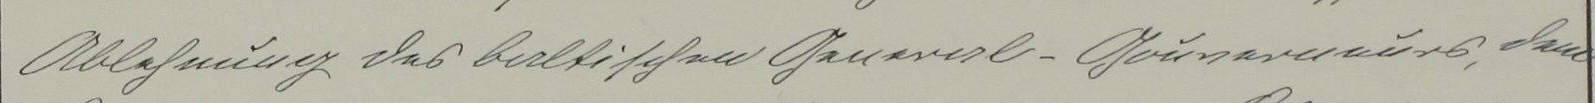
Ablehnung des baltischen General-Gouverneurs, dem
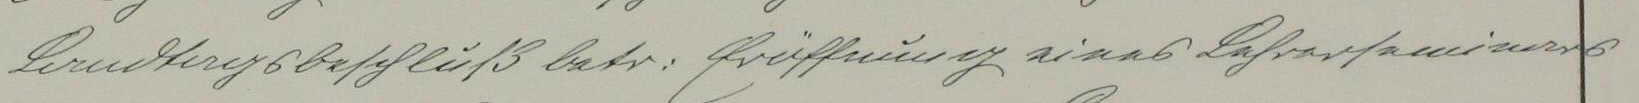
Landtagsbeschluß betr. Eröffnung eines Lehrerseminars
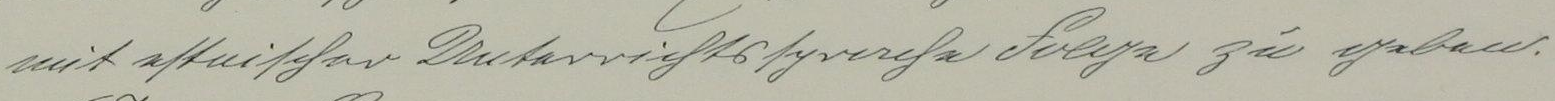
mit estnischer Unterrichtssprache Folge zu geben.
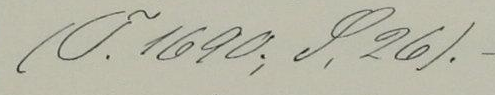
(T.1690; S.26).
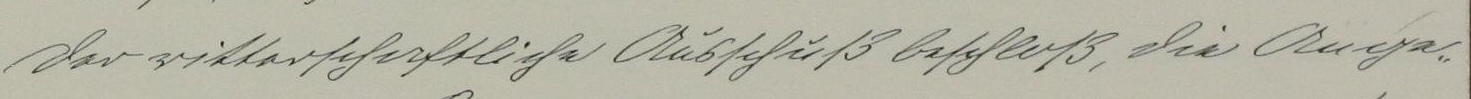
Der ritterschaftliche Ausschuß beschloß, die Ange-
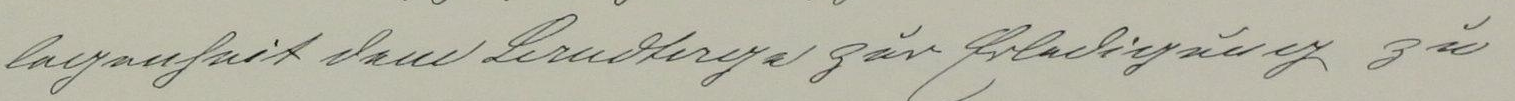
legenheit dem Landtage zur Erledigung zu
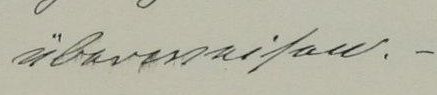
überweisen.
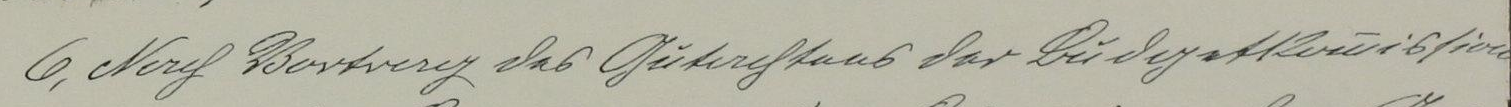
6. Nach Vortrag des Gutachtens der Budgetkommission
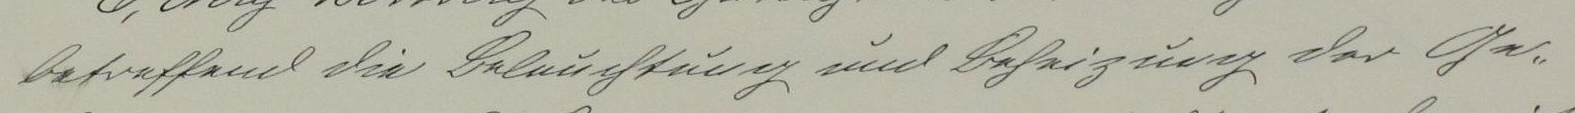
betreffend die Beleuchtung und Beheizung der Ge-
